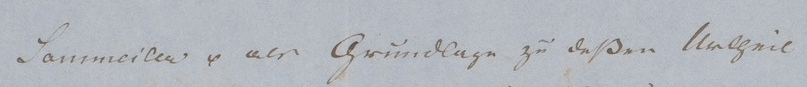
Sommeiler & als Grundlage zu deßen Urtheil
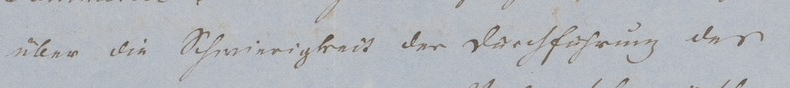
über die Schwierigkeit der Durchführung des
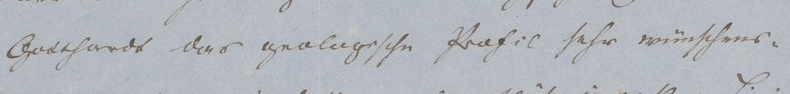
Gotthardt das geologische Profil sehr wünschens-
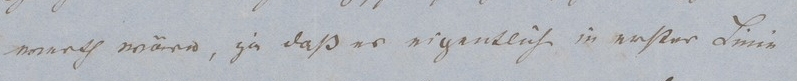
werth wäre, ja daß es eigentlich in erster Linie
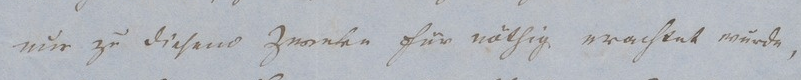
nur zu diesem Zweke für nöthig erachtet wurde,
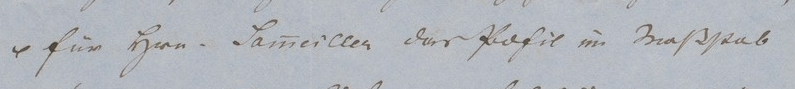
& für Hrn. Sommeiler das Profil im Maßstab
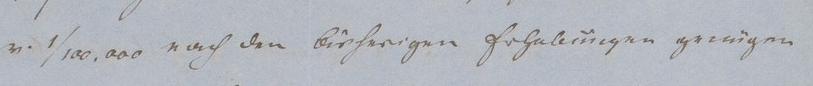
v. 1/100.000 nach den bisherigen Erhebungen genügen
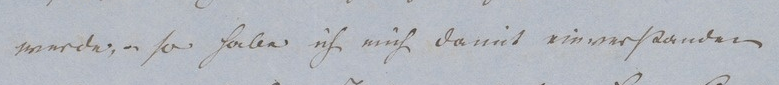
werde, so habe ich mich damit einverstanden
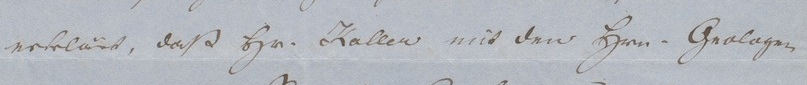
erklärt, daß Hr. Koller mit den Hrn. Geologen
